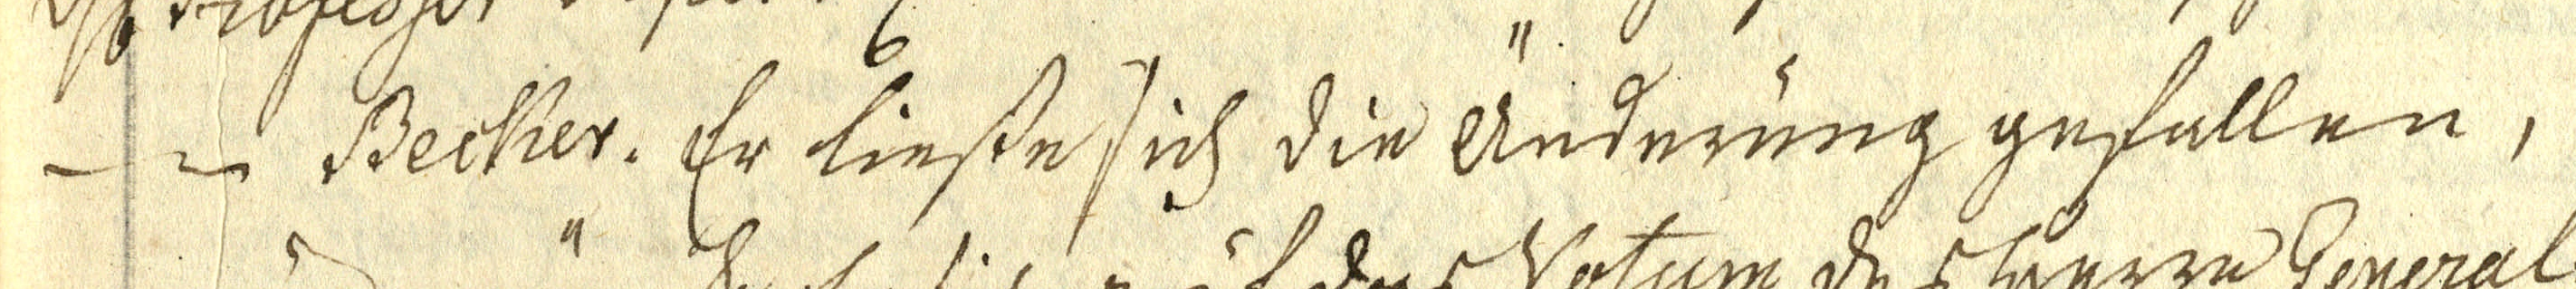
Becker. Er ließe sich die Änderung gefallen,
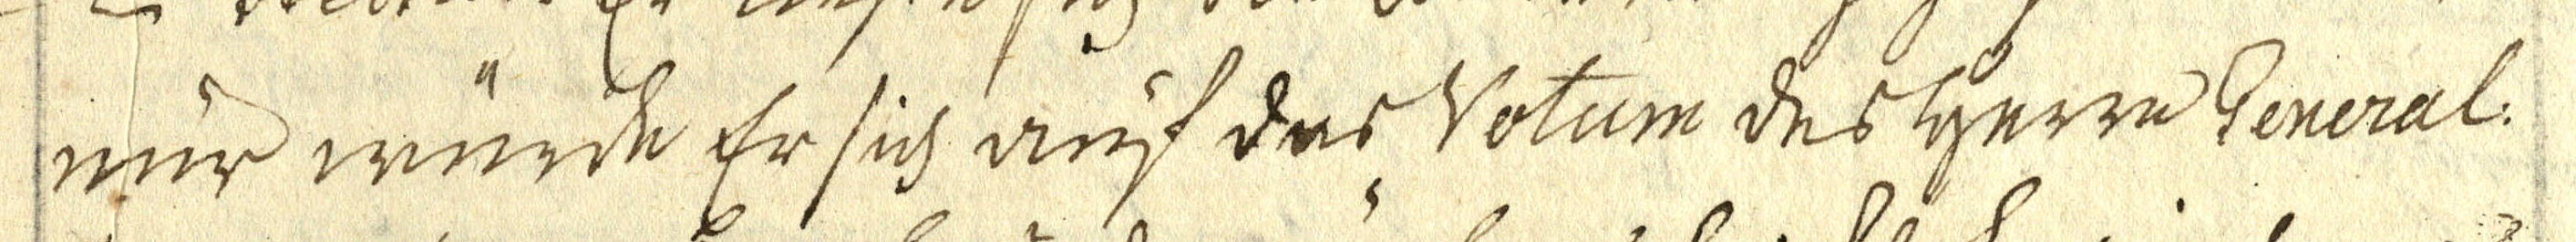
nur würde Er sich auf das Votum des Herrn General
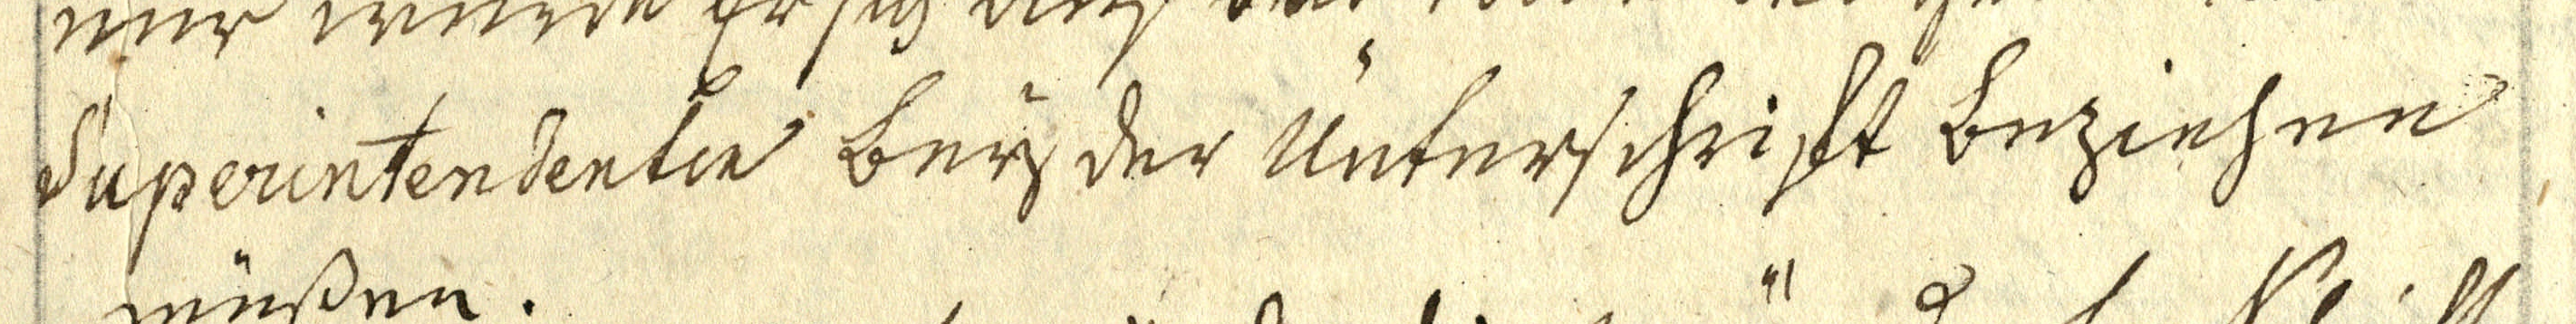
Superintendenten beÿ der Unterschrift beziehen
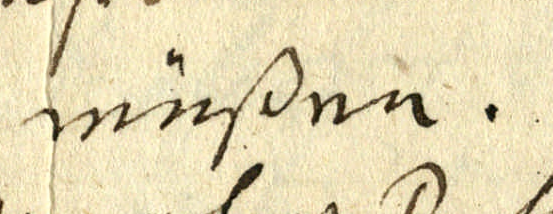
müßen.
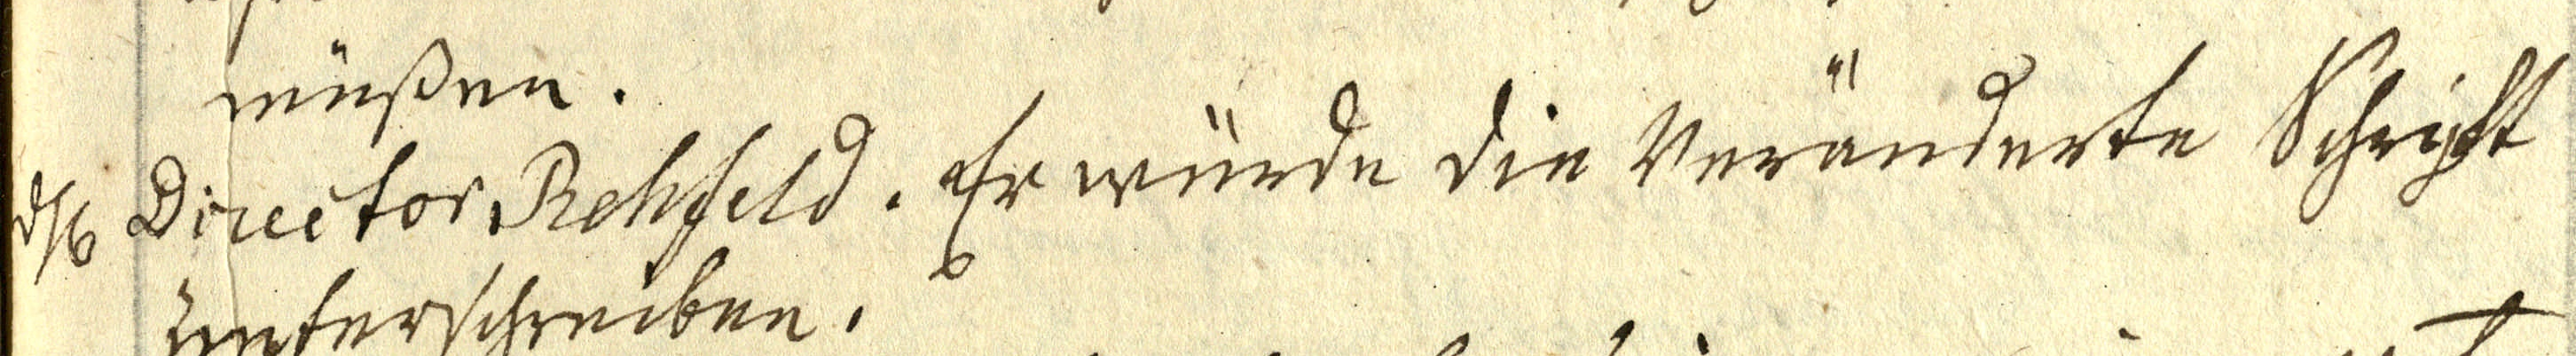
dh Director Rehfeld. Er würde die veränderte Schrift
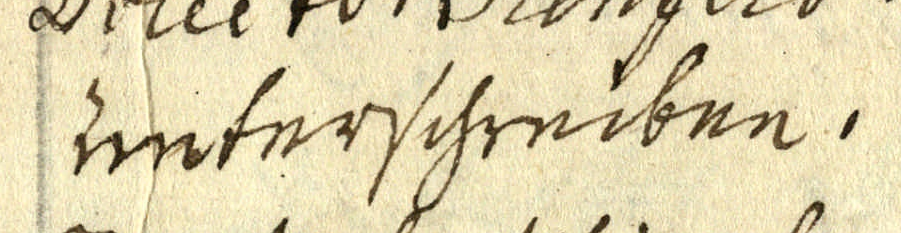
unterschreiben,
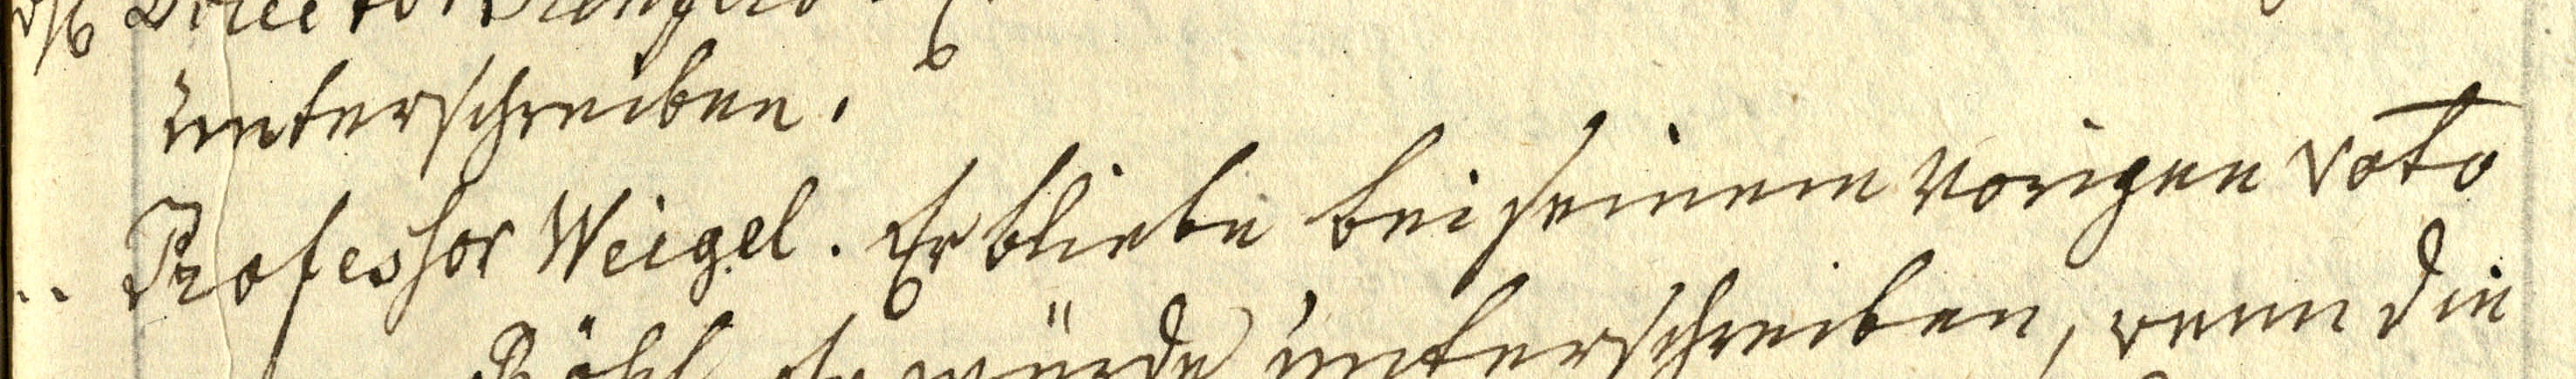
Professor Weigel. Er bliebe bei seinem vorigen voto
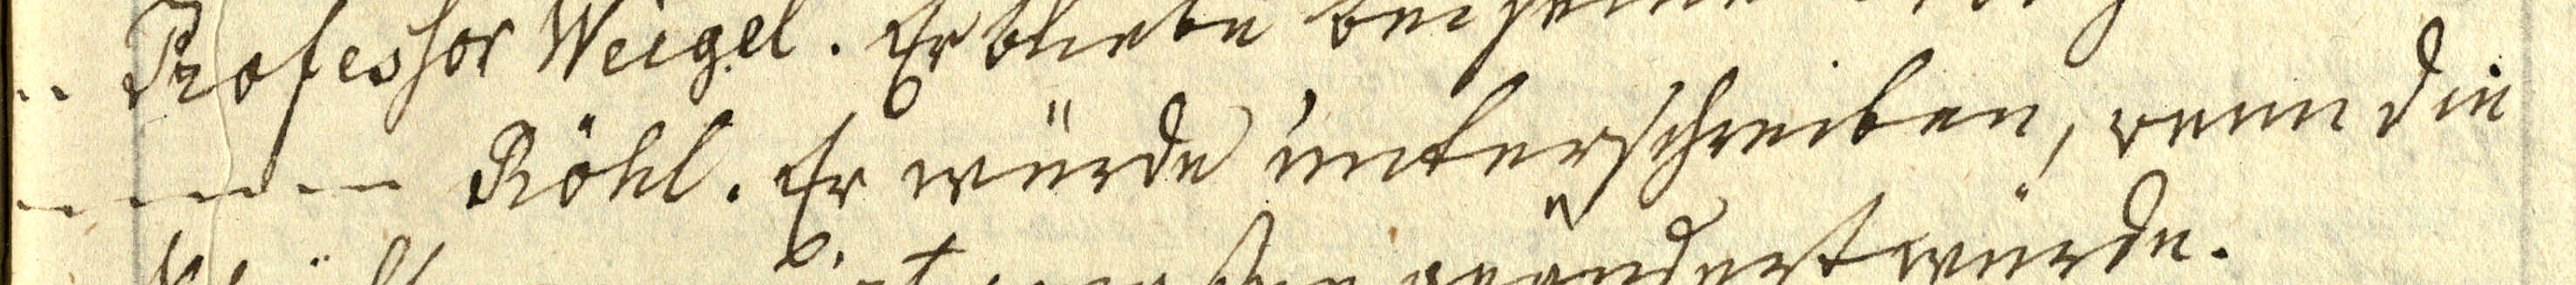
Röhl. Er würde unterschreiben, wenn die
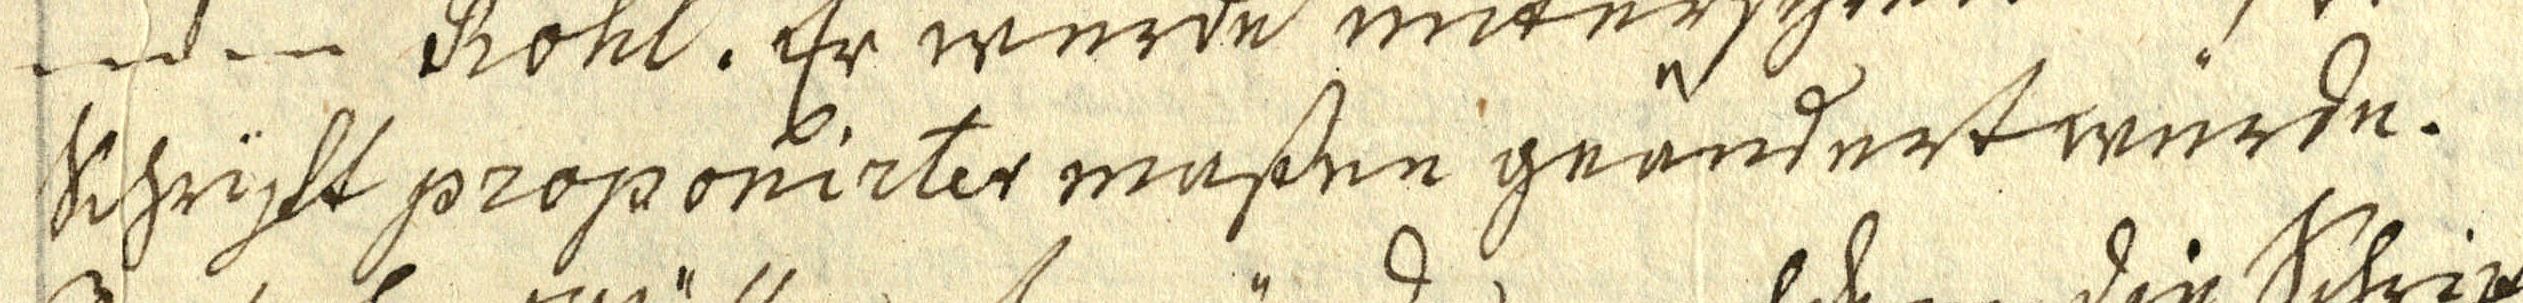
Schrift proponirter maßen geändert würde.
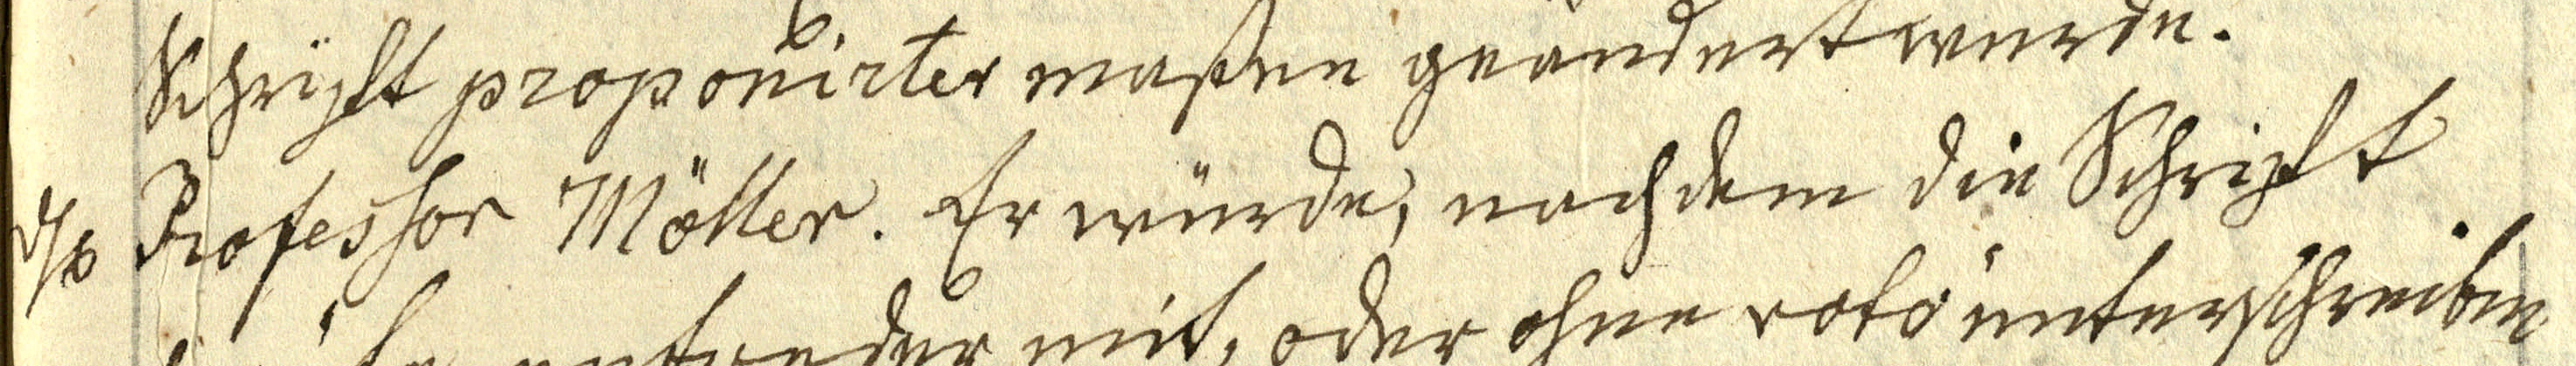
dh Professor Möller. Er würde, nachdem die Schrift
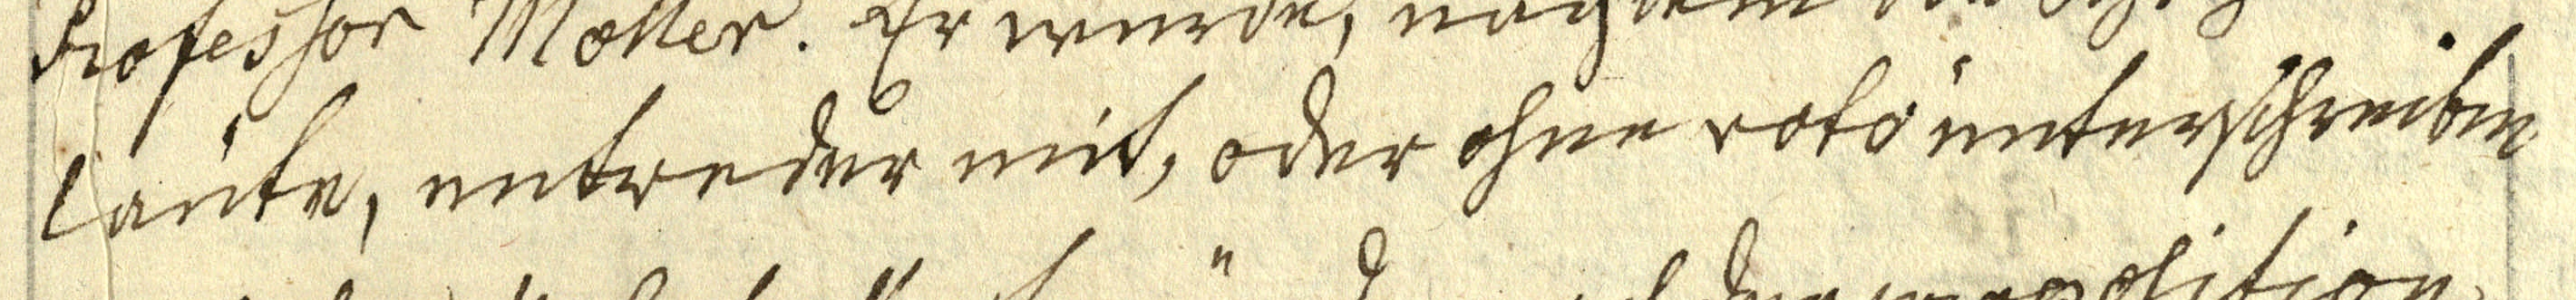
laute, entweder mit, oder ohne voto unterschreiben.
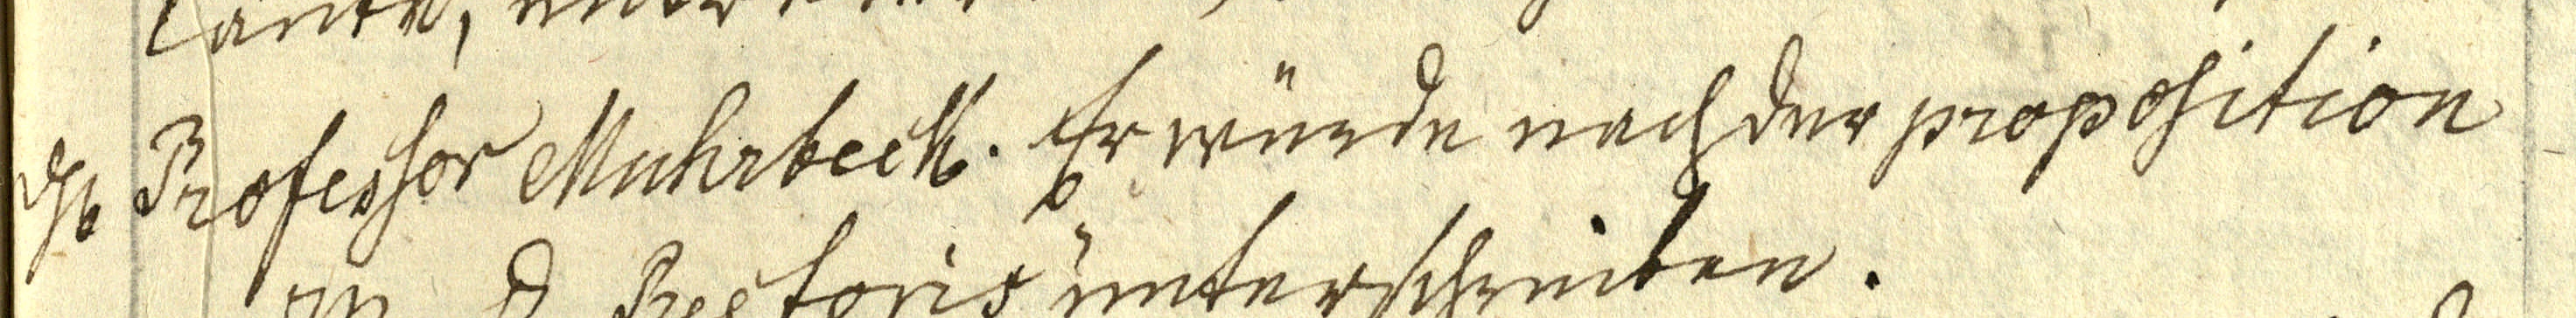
dh. Professor Muhrbeck. Er würde nach der proposition
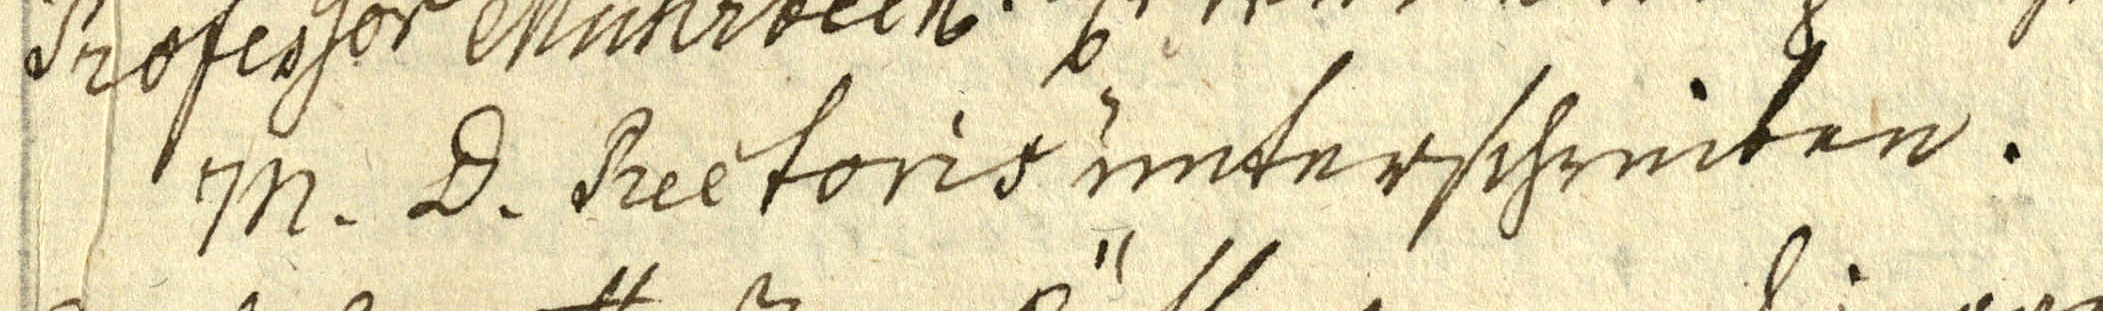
M. D. Rectoris unterschreiben.
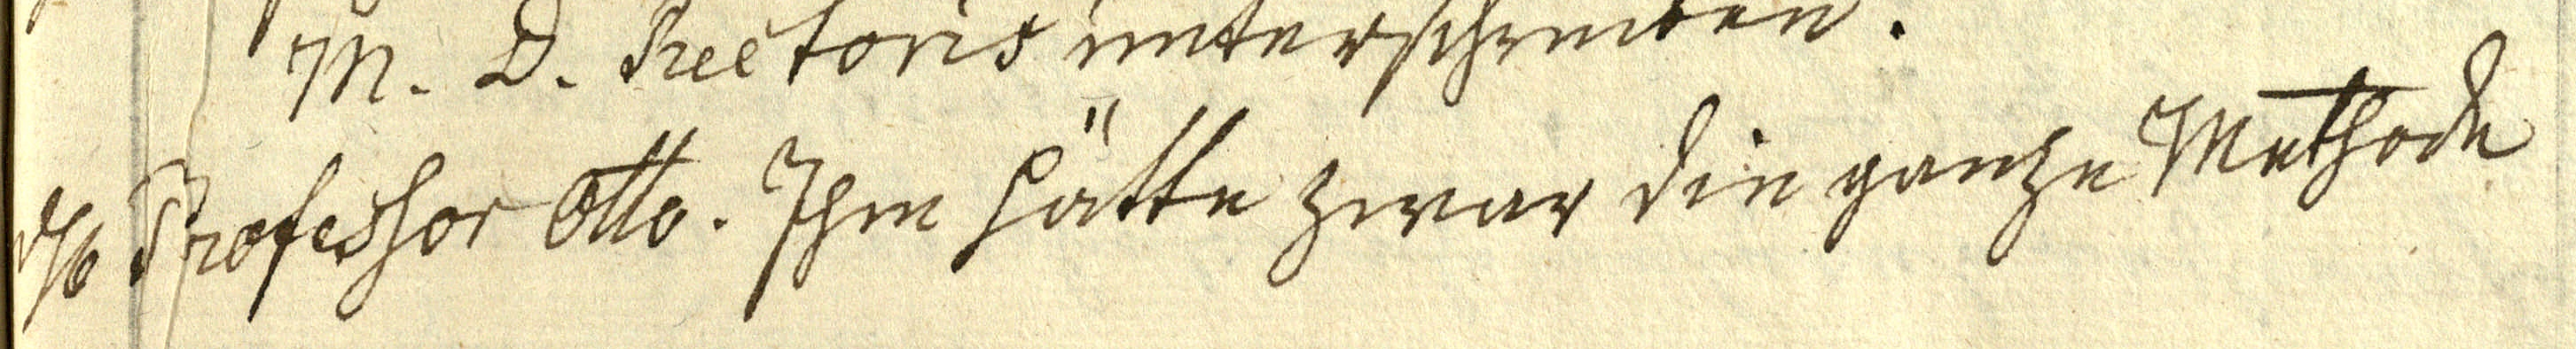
dh. Professor Otto. Ihm hätte zwar die ganze Methode
